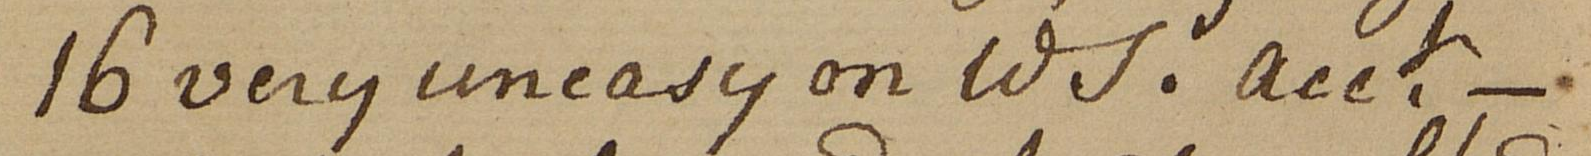16 very uneasy on WS^s. acc^t.-
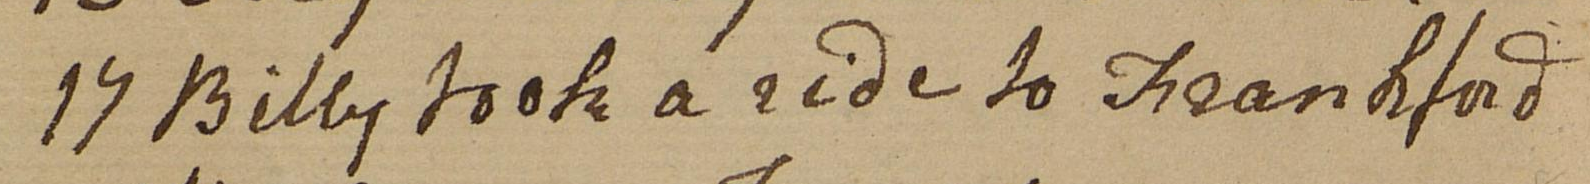17 Billy took a ride to Frankford
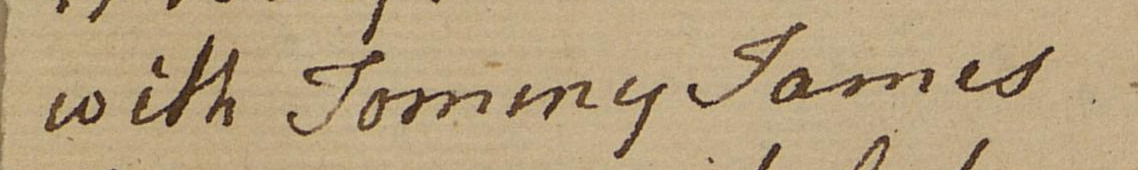with Tommy James
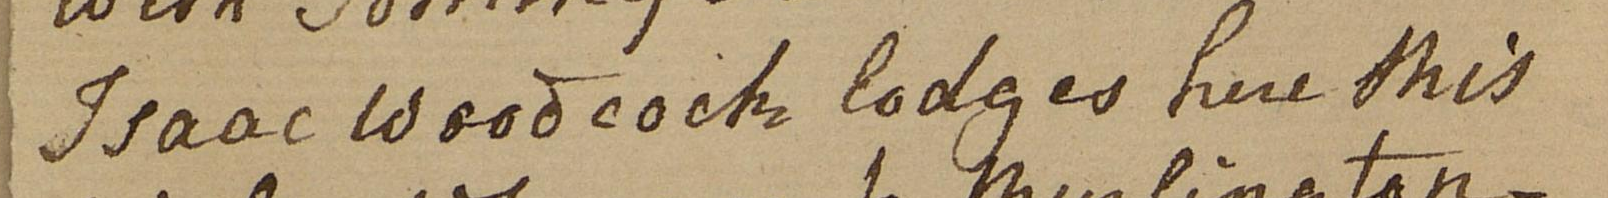Isaac Woodcock lodges here this
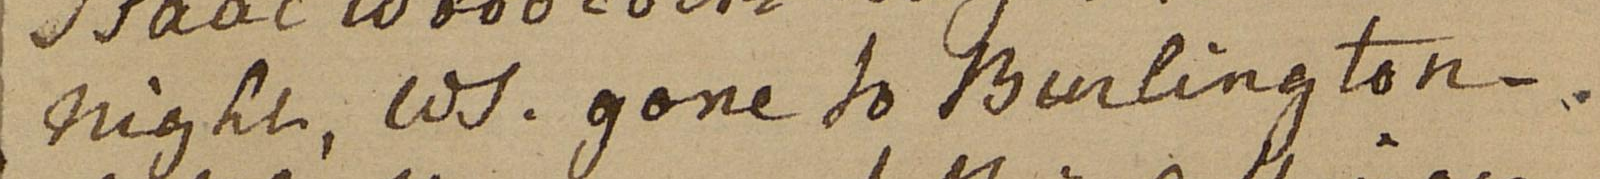Night, WS. gone to Burlington-
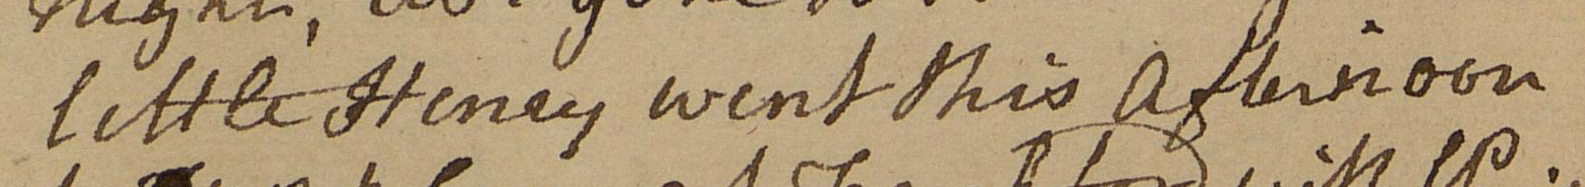little Henry went this Afternoon
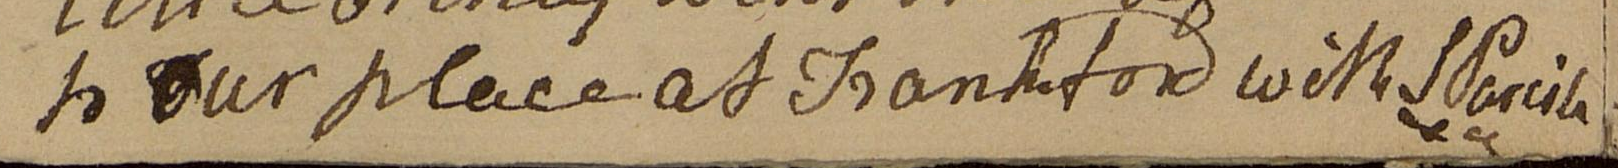to Our place at Frankford with S Parish
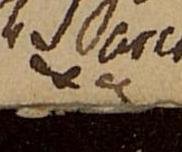&c
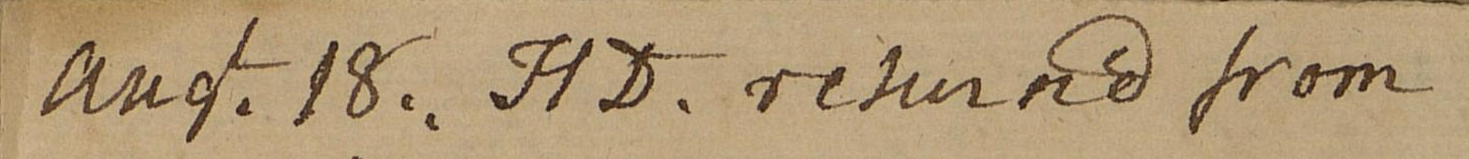Aug^t. 18. HD. return'd from
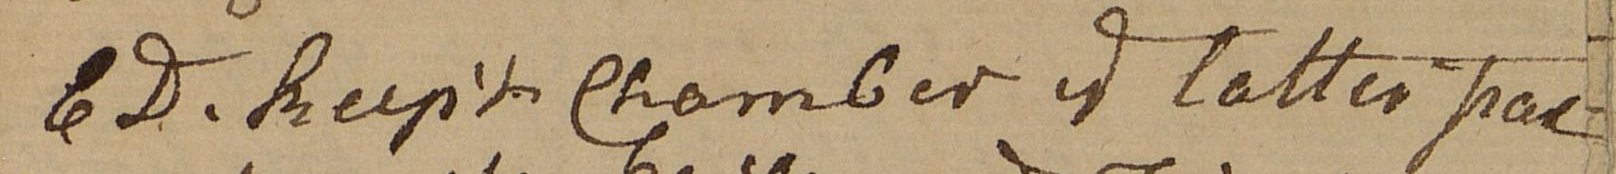ED. keep't Chamber y^e latter par
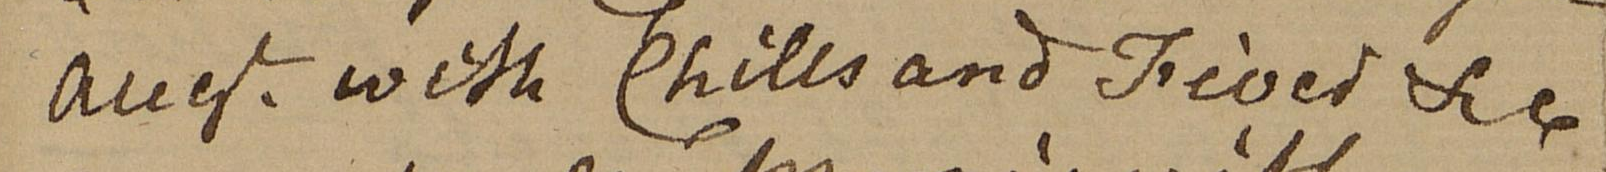Aug^t. with Chills and Fiver &c
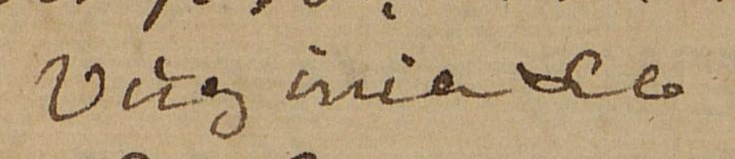Virginia &c
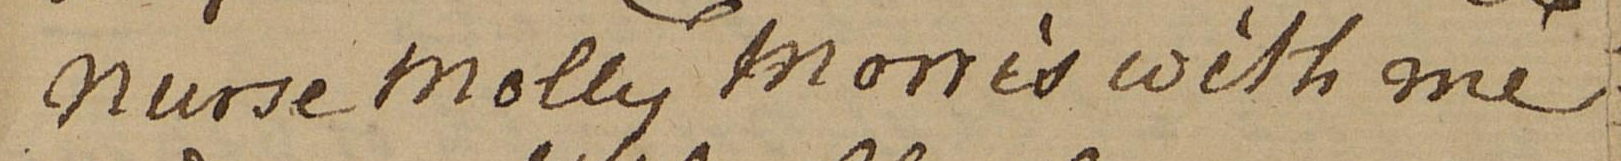Nurse Molly Morris with me
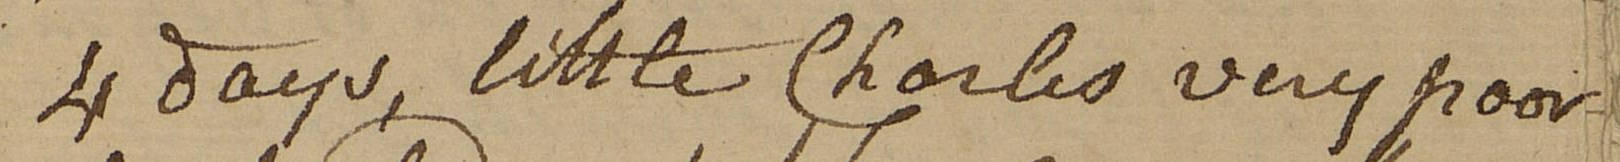4 days, little Charles very poor
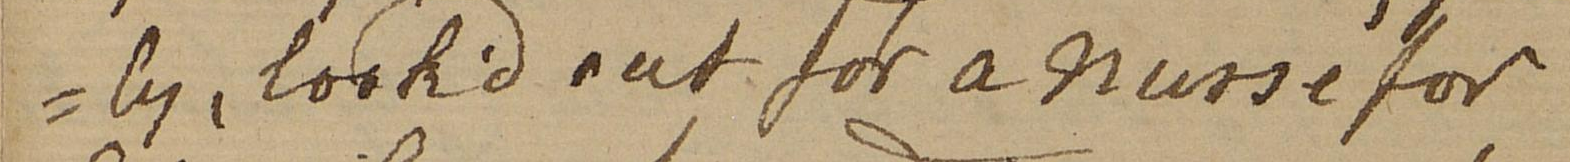-ly, look'd out for a nurse for
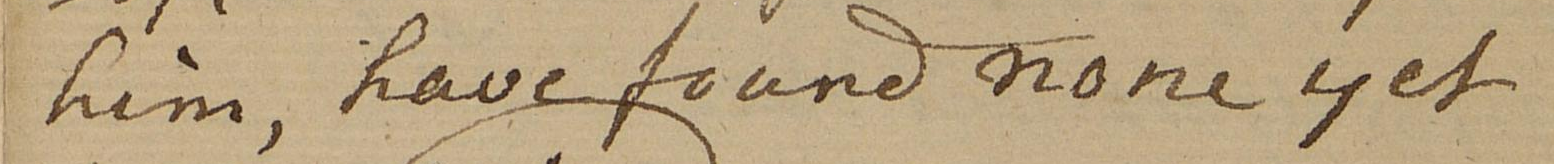him, have found none yet
